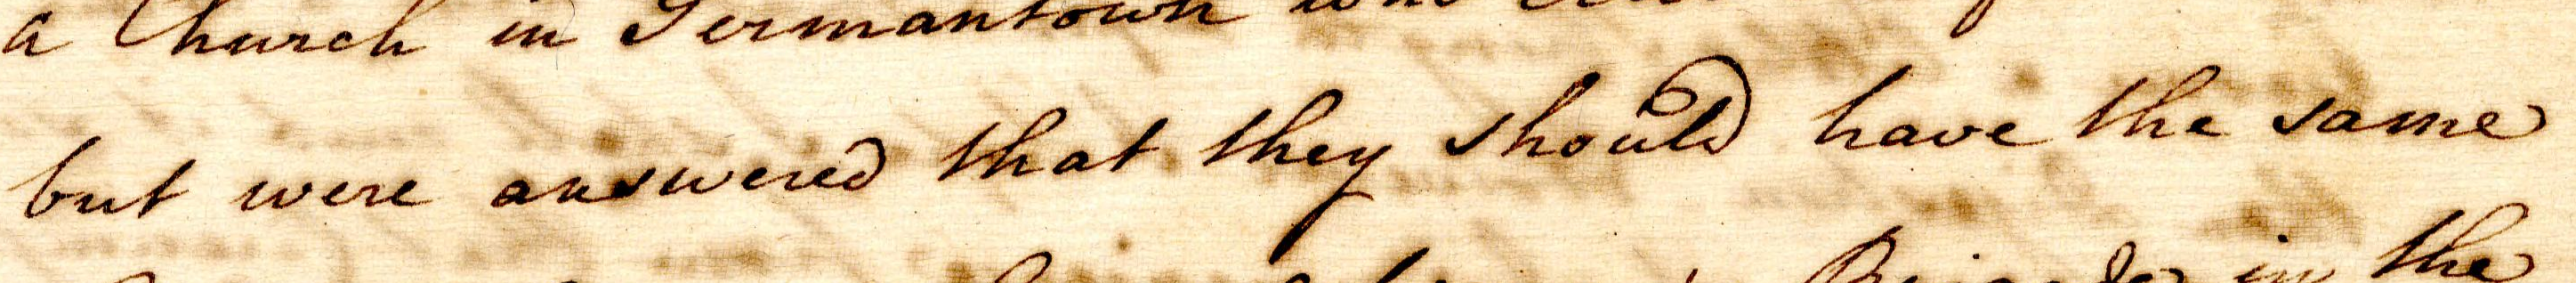but were answered that they should have the same
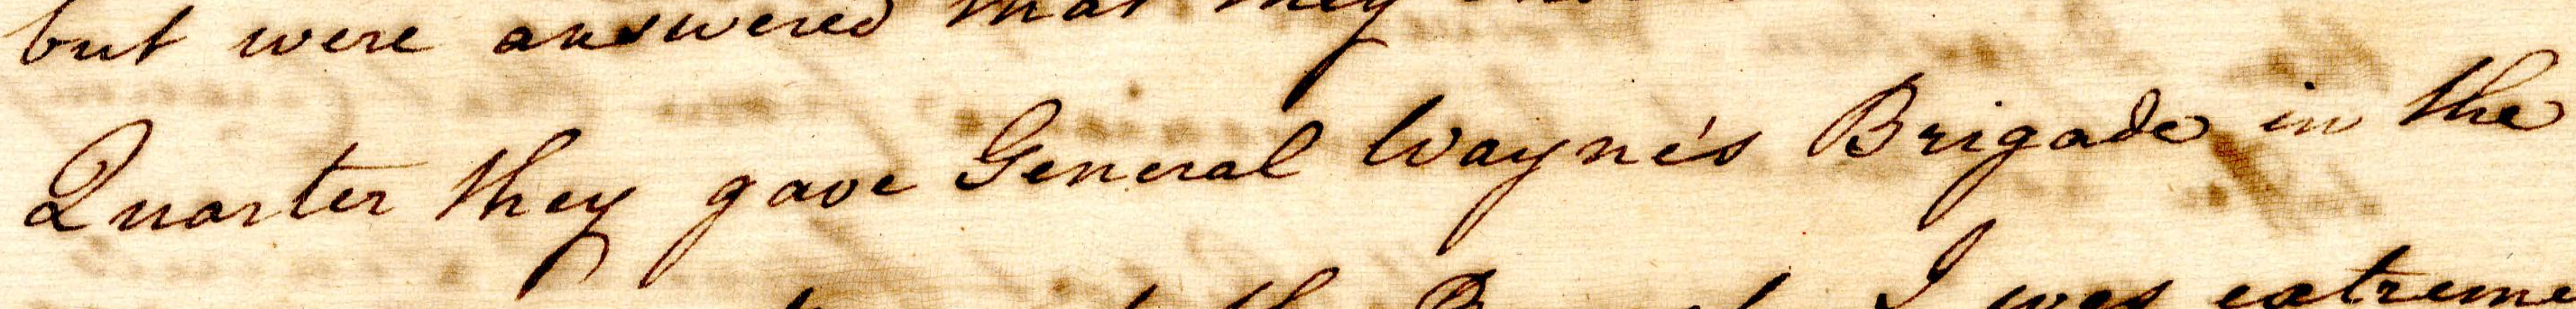Quarter they gave General Wayne's Brigade in the
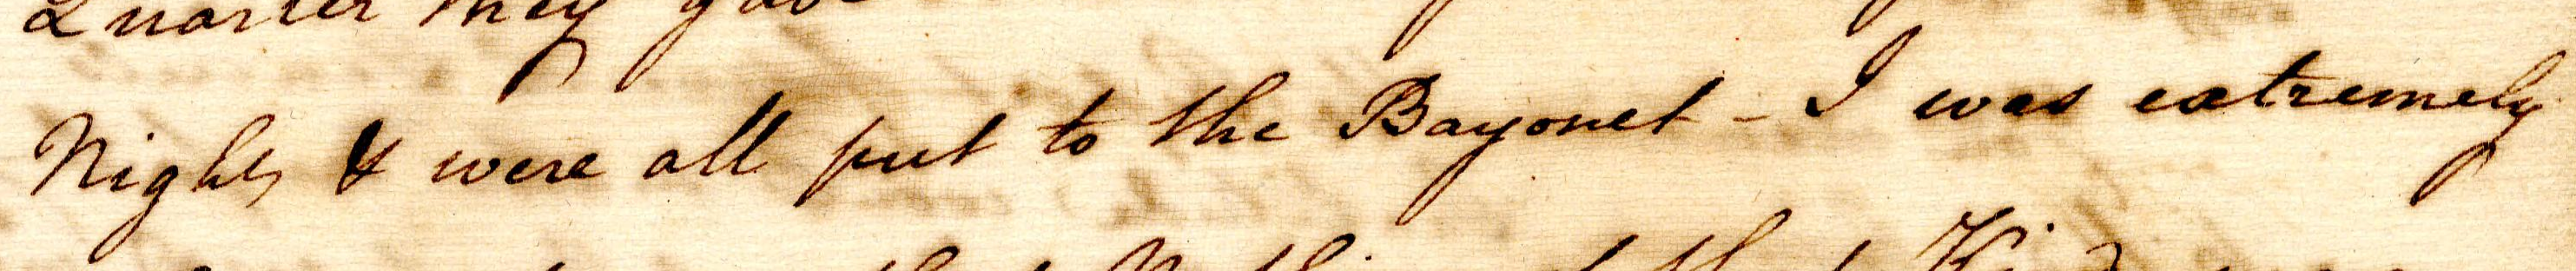Night & were all put to the Bayonet- I was extremely
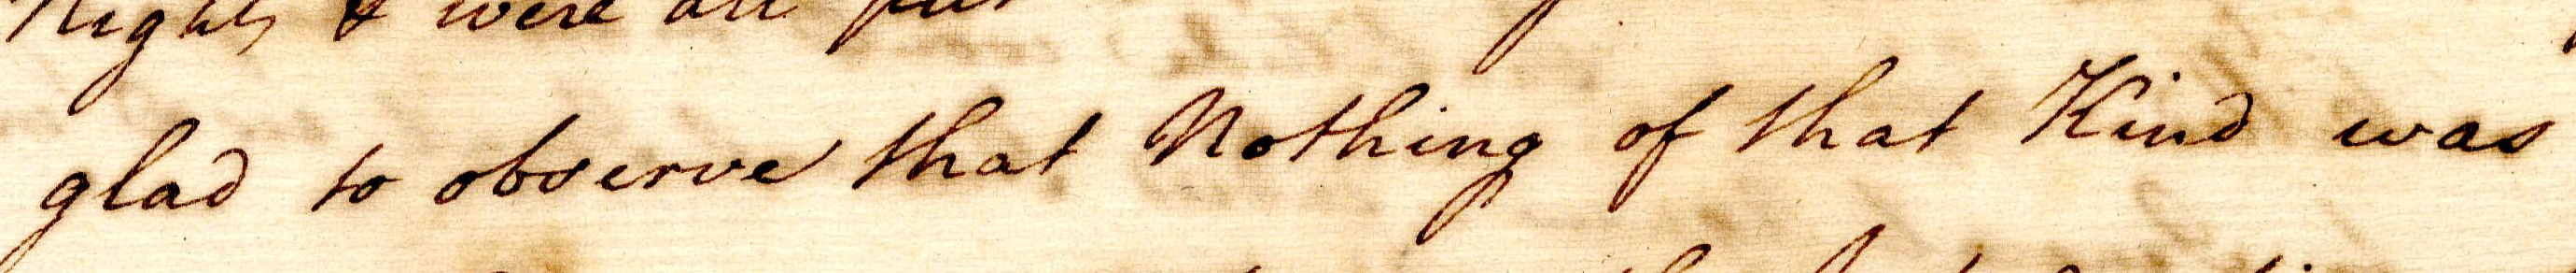glad to observe that Nothing of that Kind was
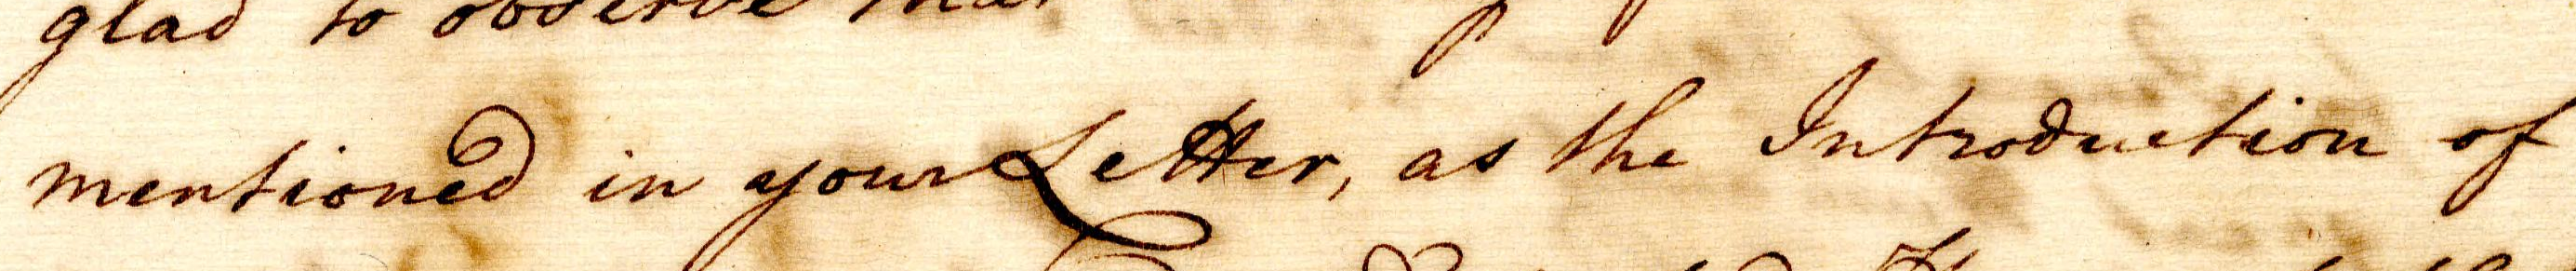mentioned in your Letter, as the Introduction of
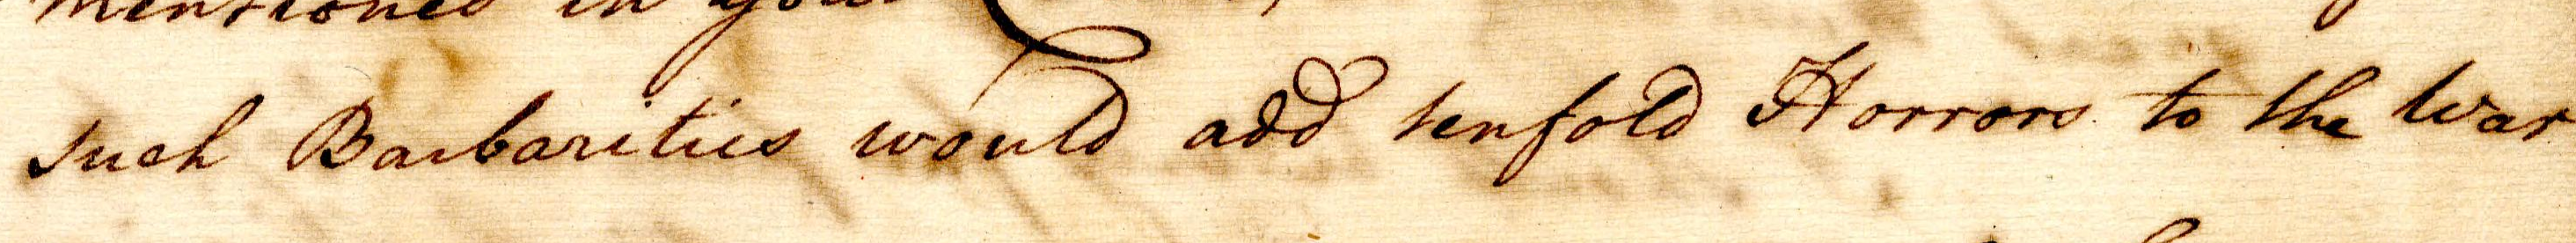such Barbarities would add tenfold Horrors to the War.
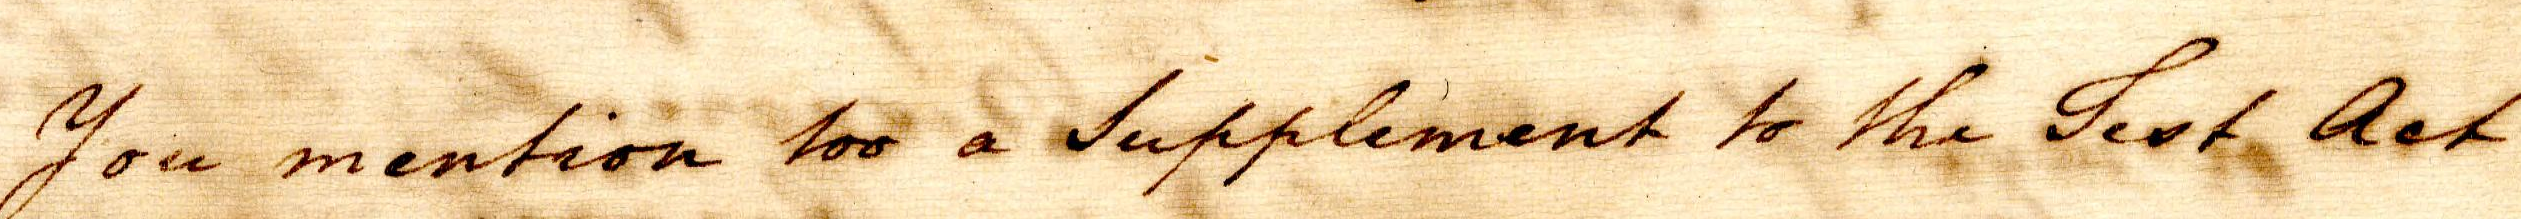You mention too a Supplement to the Test Act
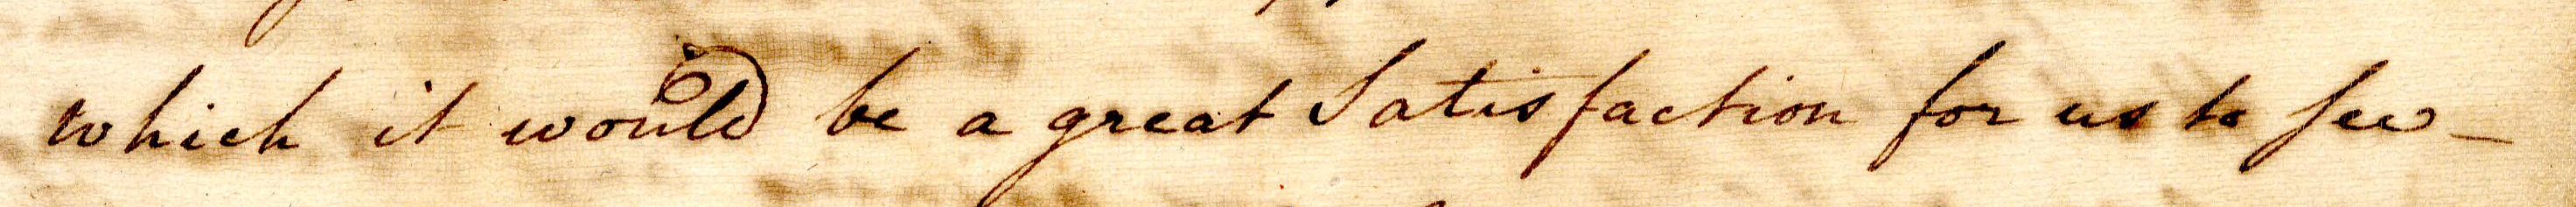which it would be a great Satisfaction for us to see-
